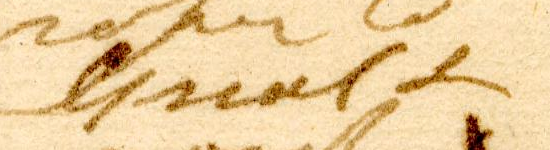Great
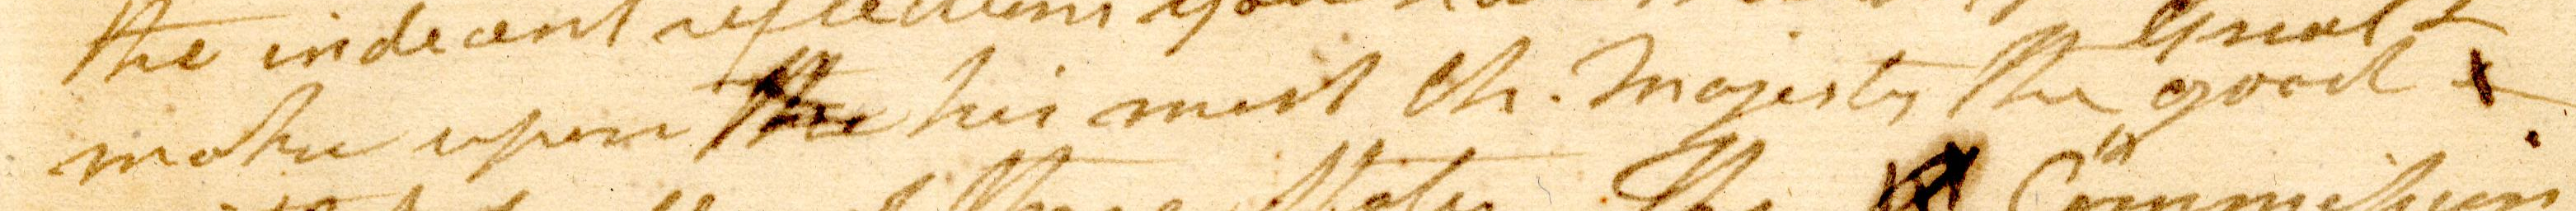make upon [the] his most h. majesty the good
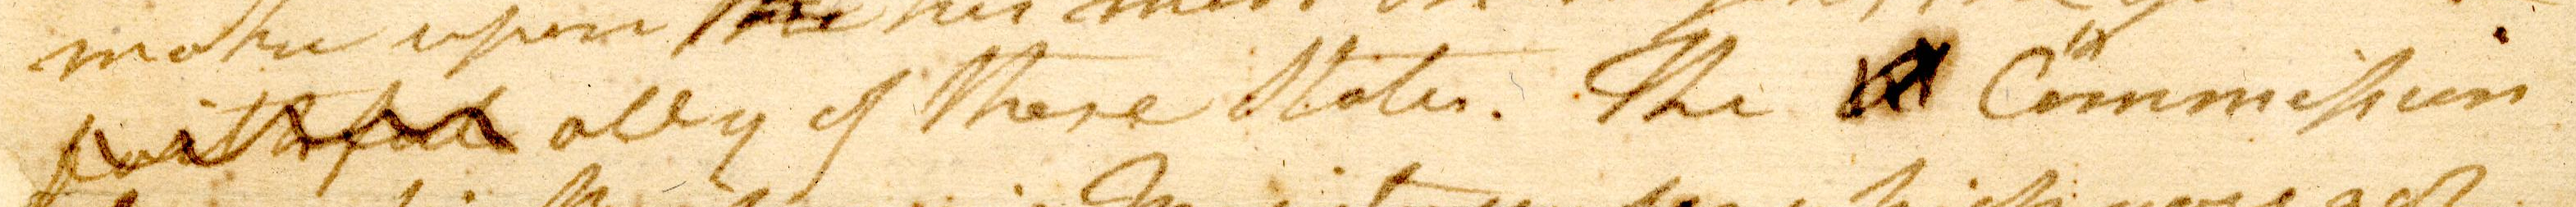[faithful] ally of these States. The [_] Commissions
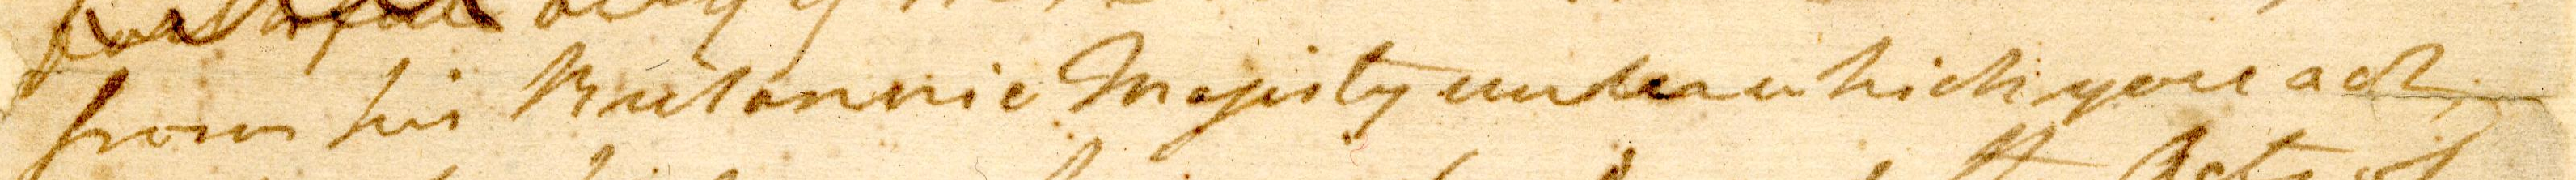from his Britannic Majesty under which you act
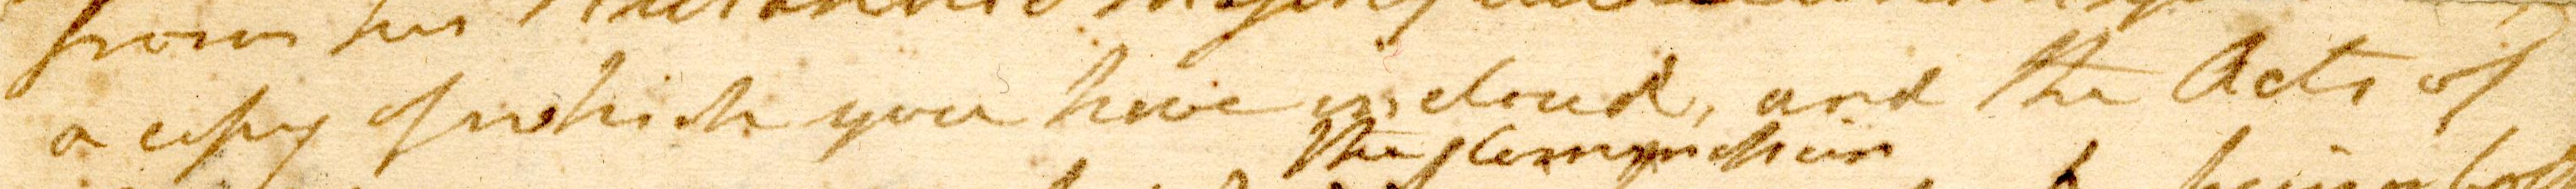a copy of which you have inclosed, and the Acts of
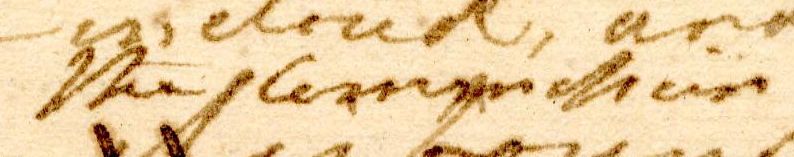the Commission
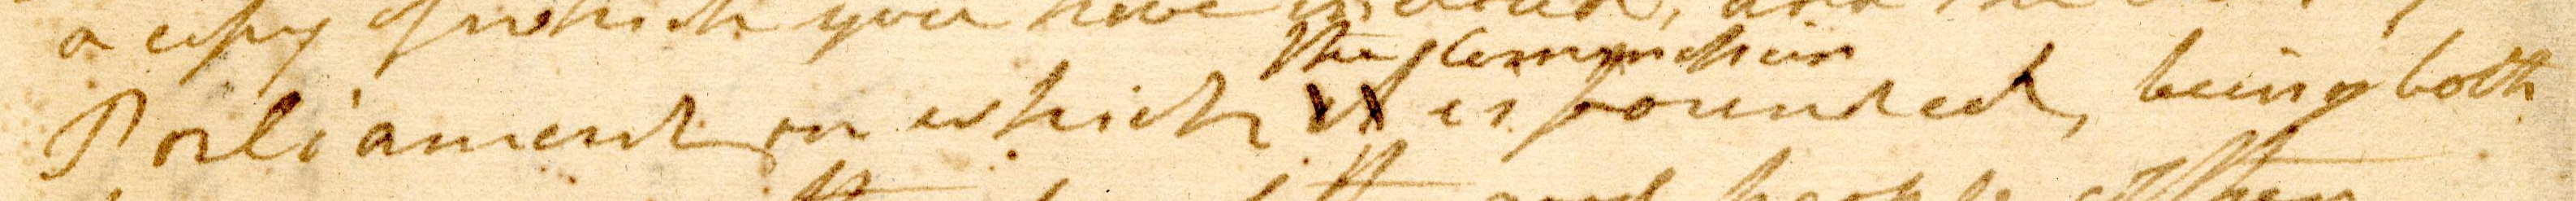Parliament on which [it] is founded, being both
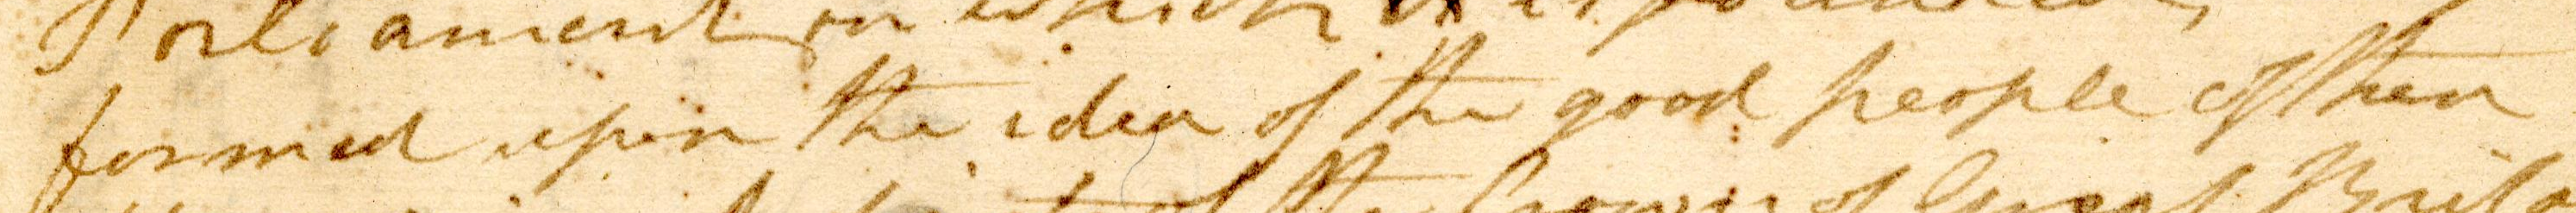formed upon the idea of the good people of these
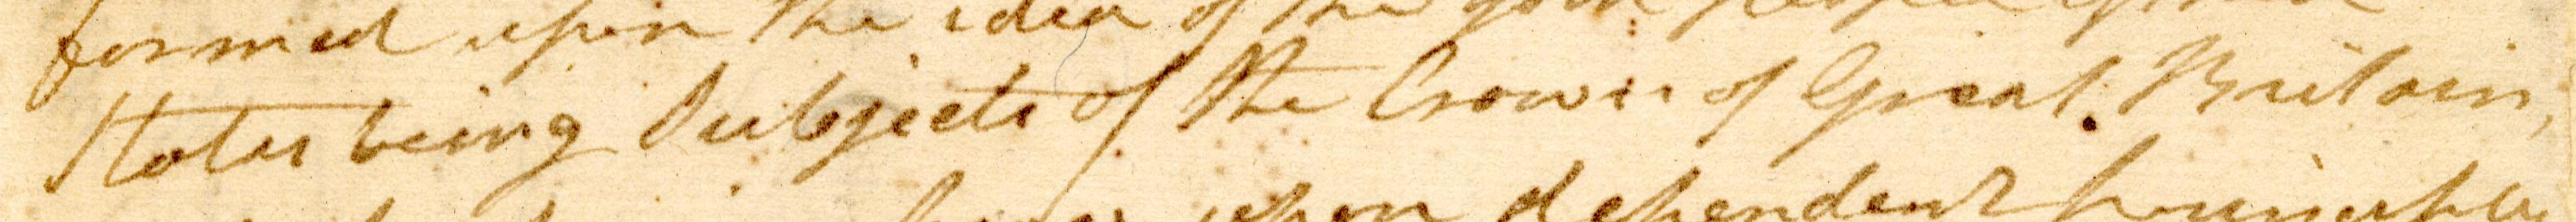States being Subjects of the Crown of Great Britain
